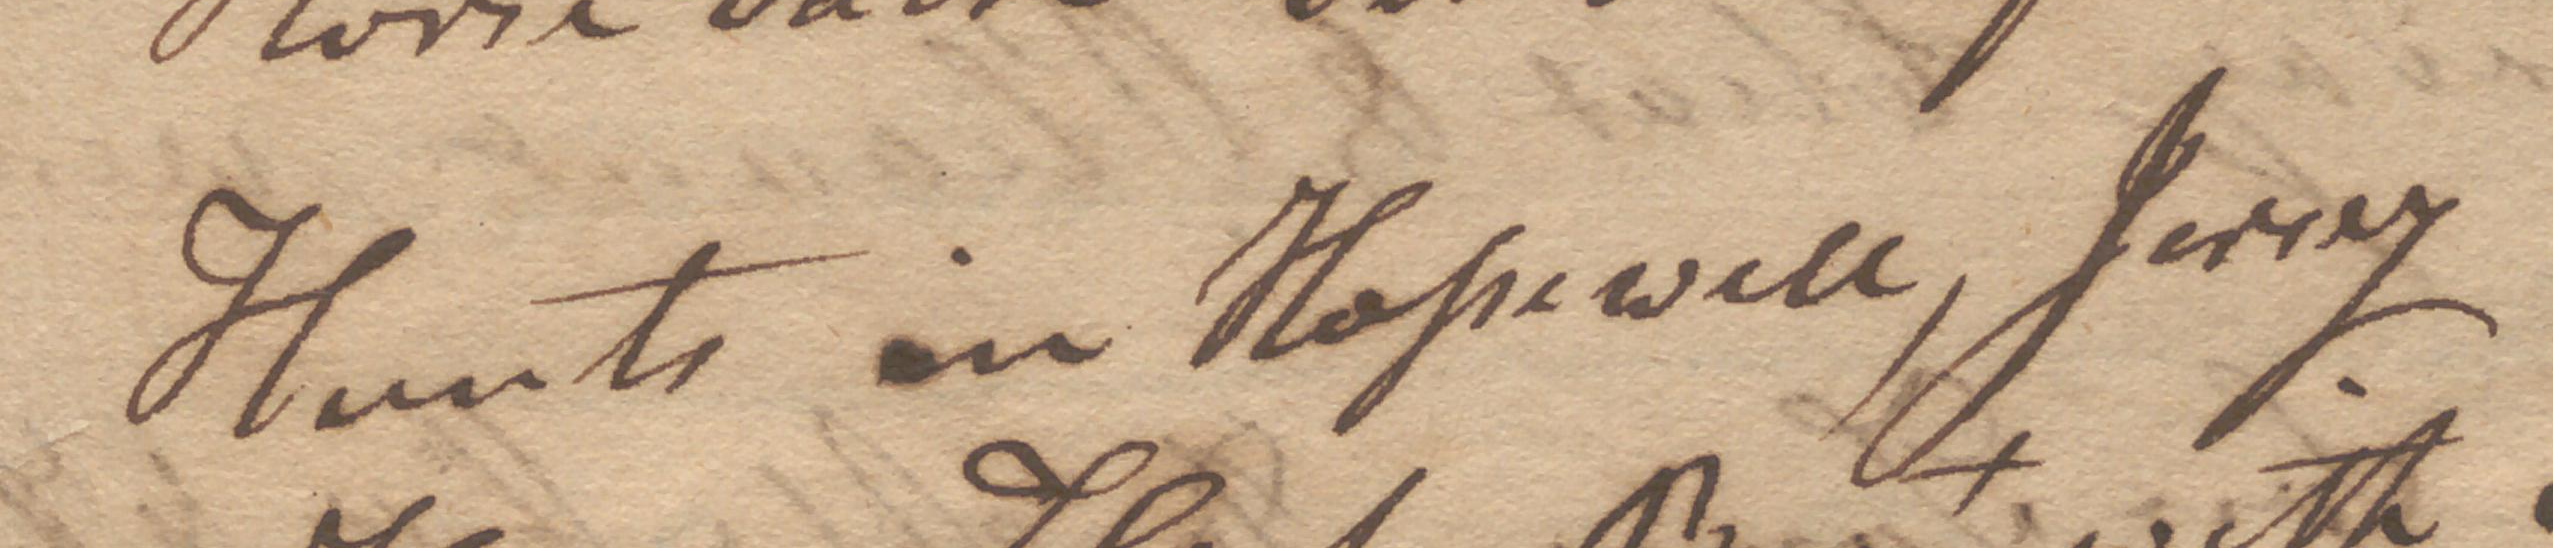Hunts in Hopewell, Jersey
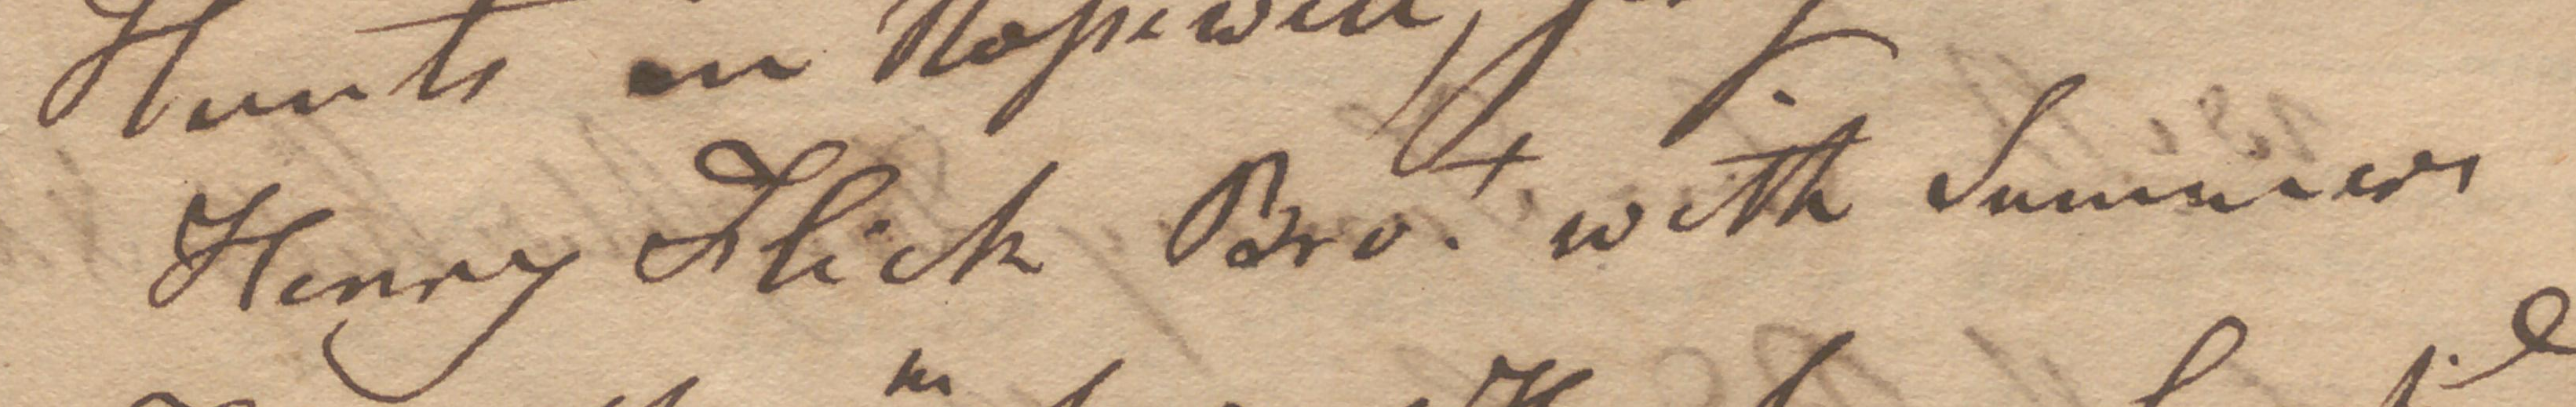Henry Flick Bro^t. with Summers
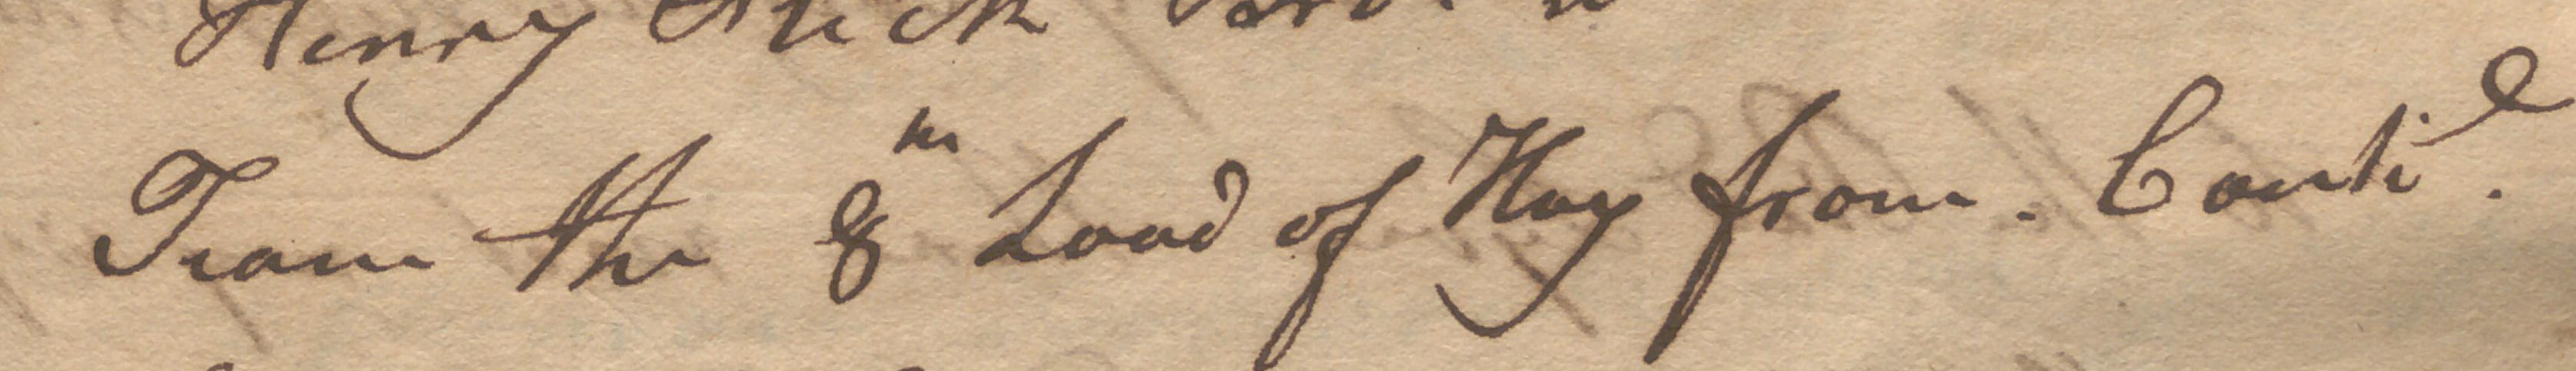Team the 8^th Load of Hay from Cont^l.
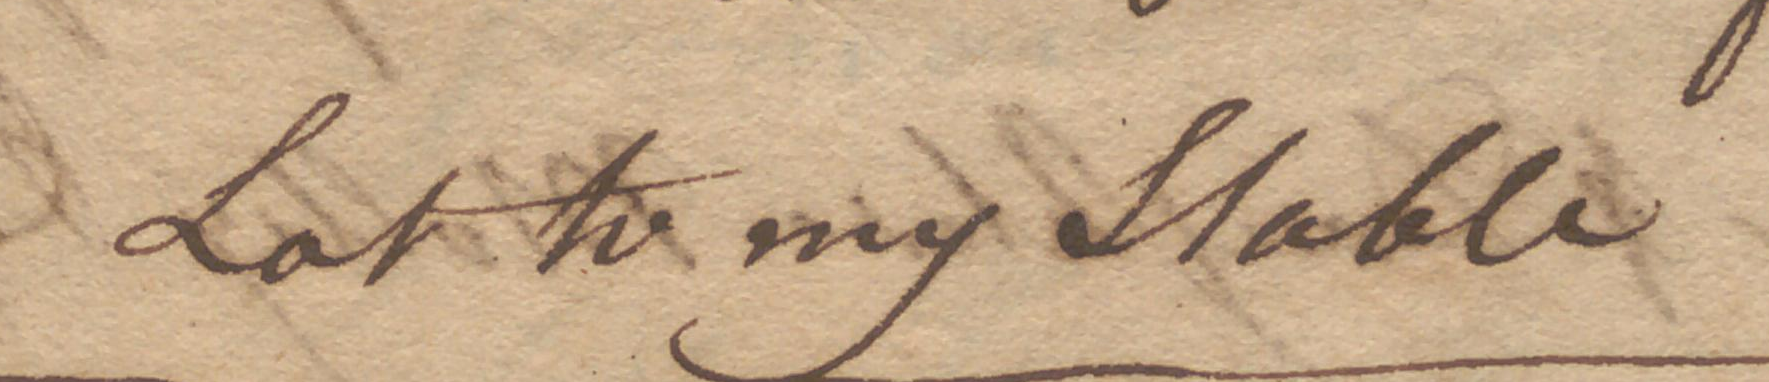Lot to my Stable
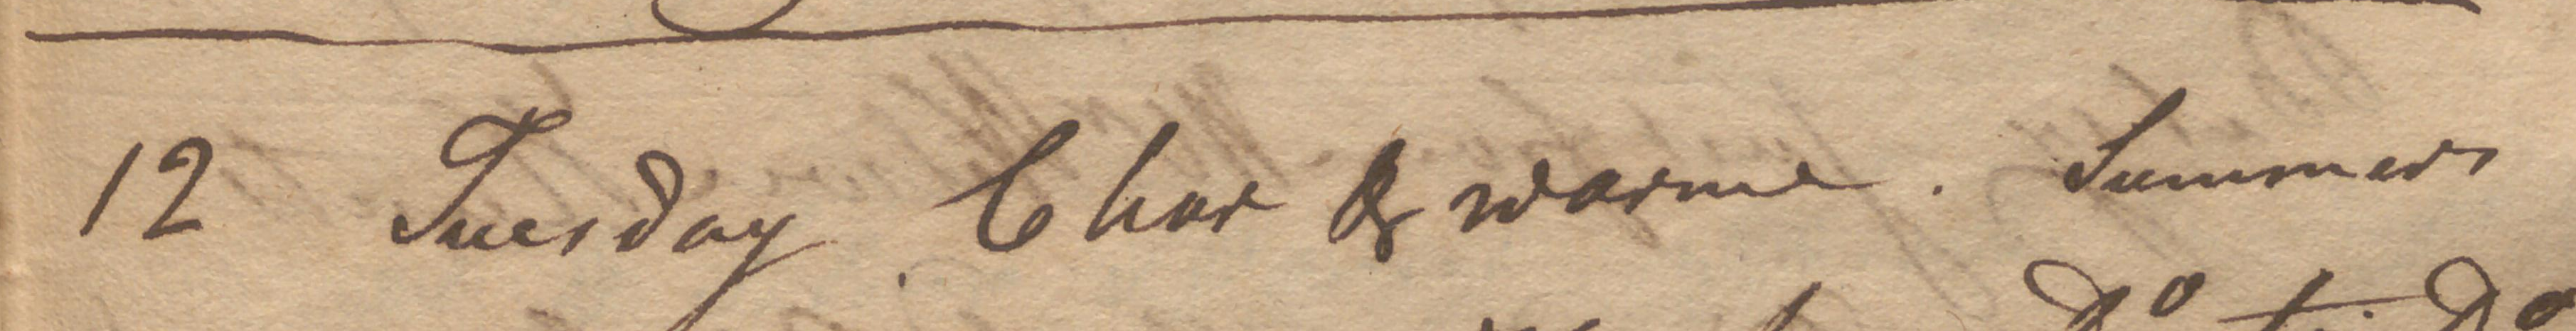12 Tuesday Clear & warme. Summers
